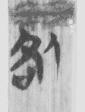咎
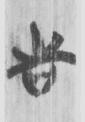告
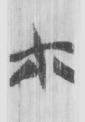尒
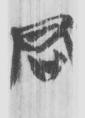君
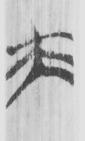夫
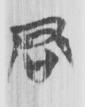君
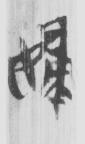婦
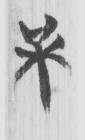某
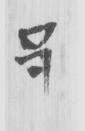邑
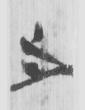之
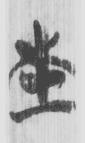{木土}
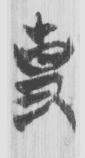吏
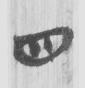四
